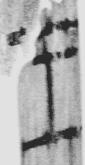王
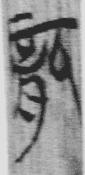龍（隆）
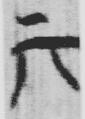亓（其）
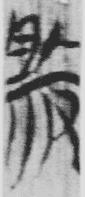祭
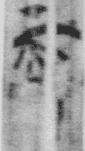而
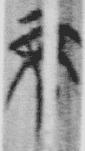不
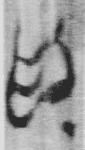爲
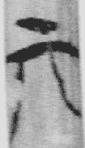亓（其）
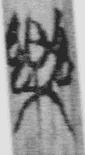樂
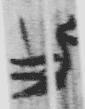此
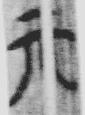亓（其）
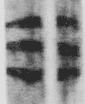三
